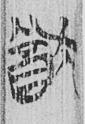○（猶）
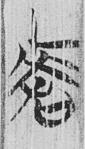差
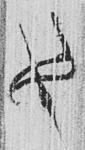民
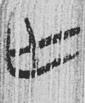亡
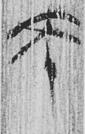不
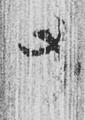又（有）
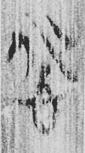○（過）
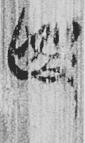○（賢）
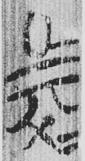者者
